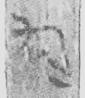九十=
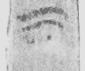三
